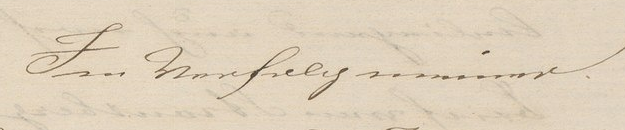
Im Verfolg meiner
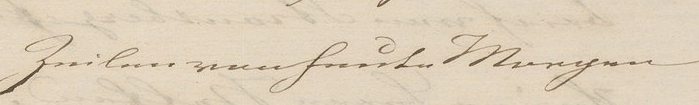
Zeilen von heute Morgen
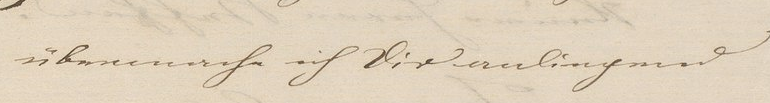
übermache ich Dir anliegend
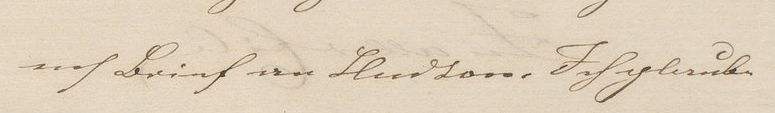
meinen Brief an Hudson. Ich glaube
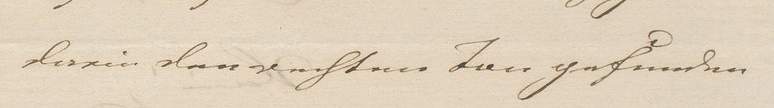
darin den rechten Ton gefunden
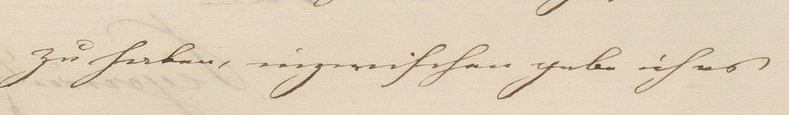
zu haben, inzwischen gebe ich es
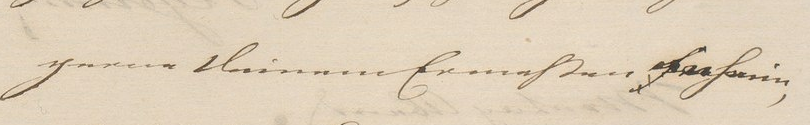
gerne Deinem Ermeßen hin anheim,
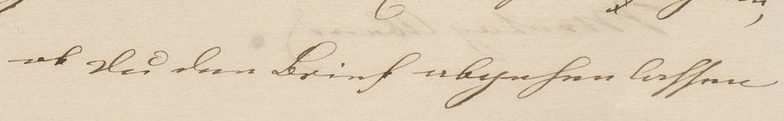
ob Du den Brief abgehen lassen
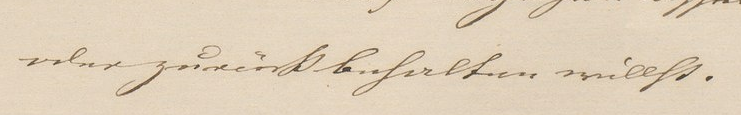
oder zurückbehalten willst.
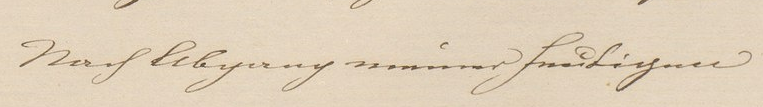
Nach Abgang meiner heutigen
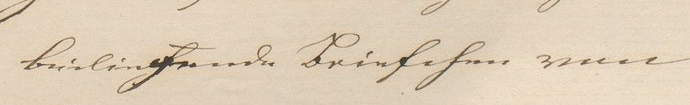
beiligende Briefchen von
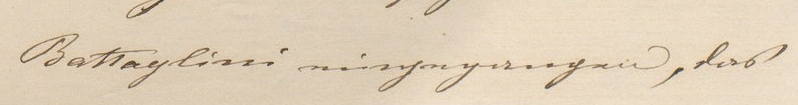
Battaglini eingegangen, das
